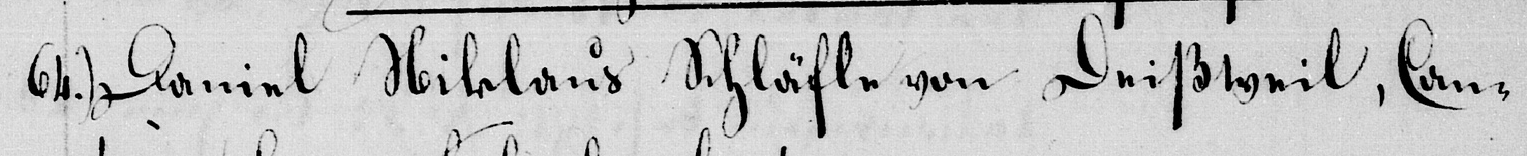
64.) Daniel Niklaus Schläfle von Deißweil, Can¬
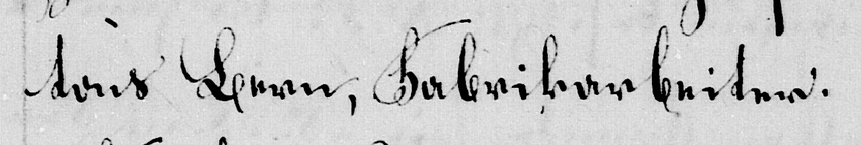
tons Bern, Fabrikarbeiter.
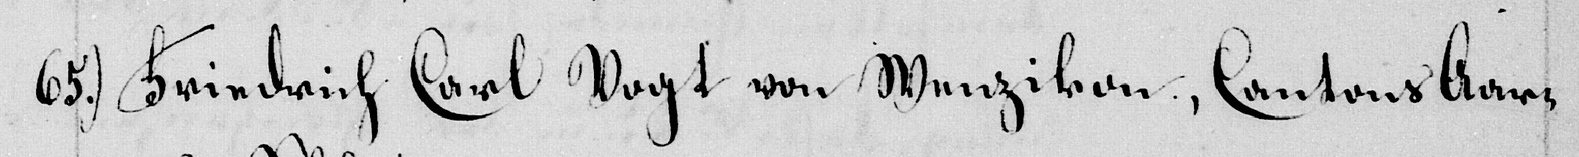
65.) Friedrich Carl Vogt von Menzikon, Cantons Aar¬
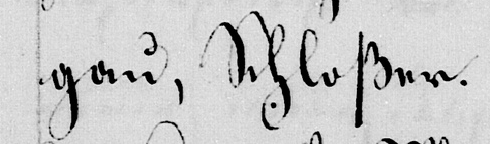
gau, Schloßer.
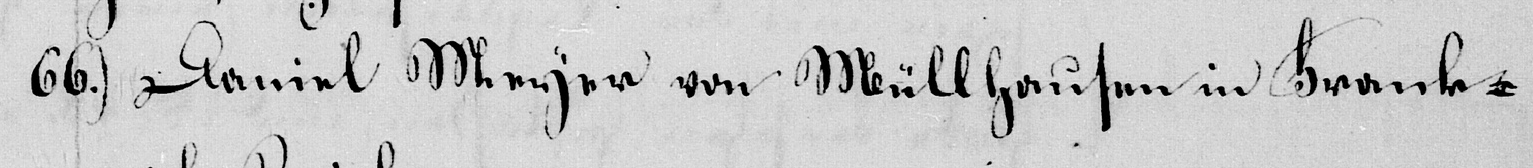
66.) Daniel Meyer von Müllhausen in Frank¬
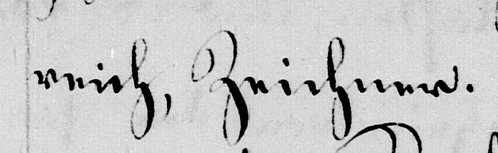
reich, Zeichner.
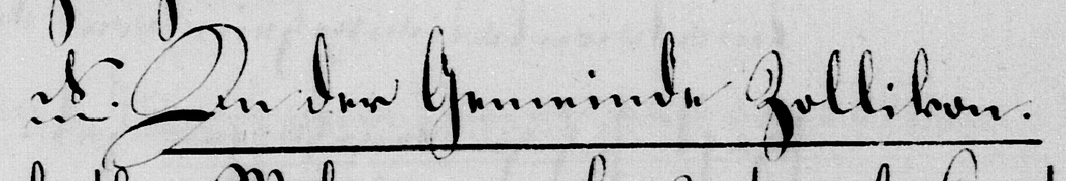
N. In der Gemeinde Zollikon.
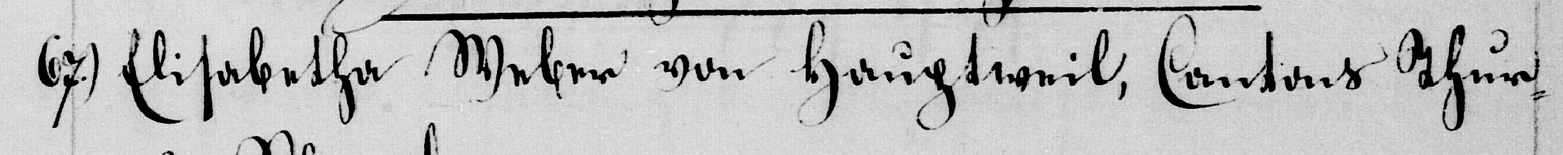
67.) Elisabetha Weber von Hauptweil, Cantons Thur¬
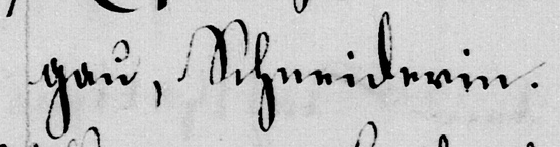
gau, Schneiderin.
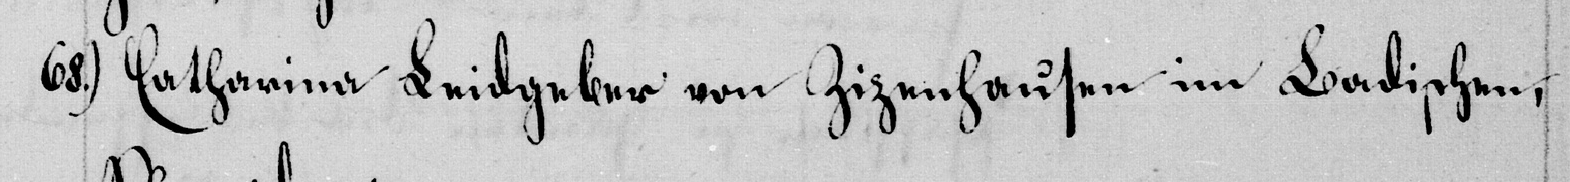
68.) Catharina Leidgeber von Zizenhausen im Badischen,
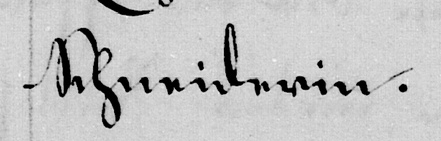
Schneiderin.
